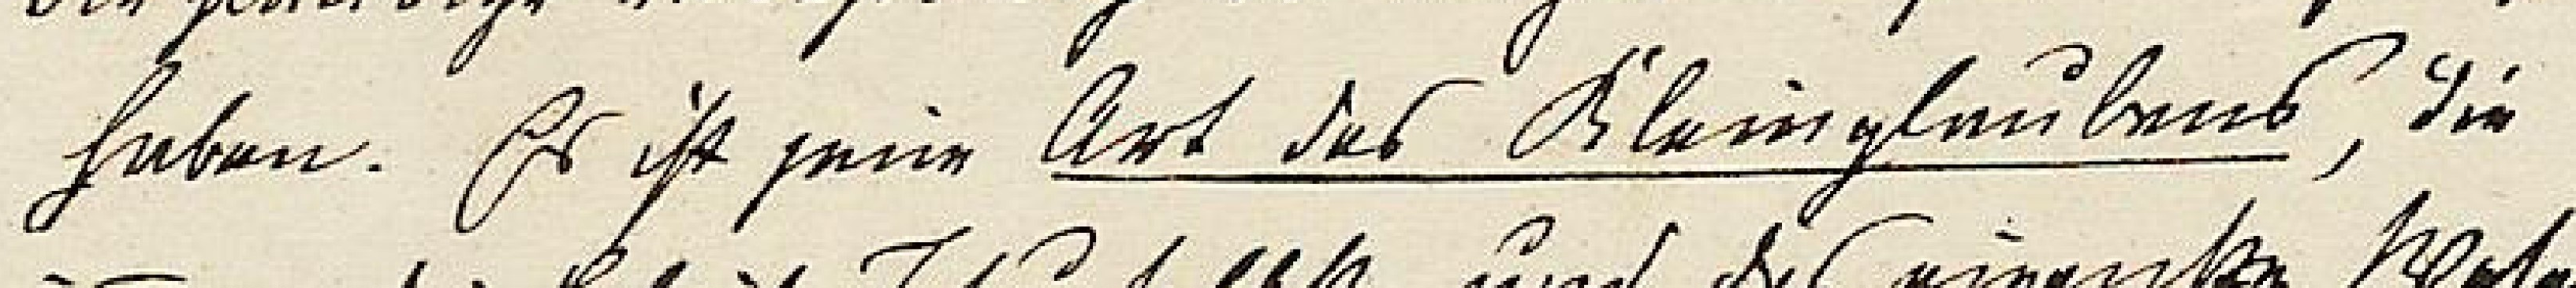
haben. Es iht jene Art des Kleinglaubens, die
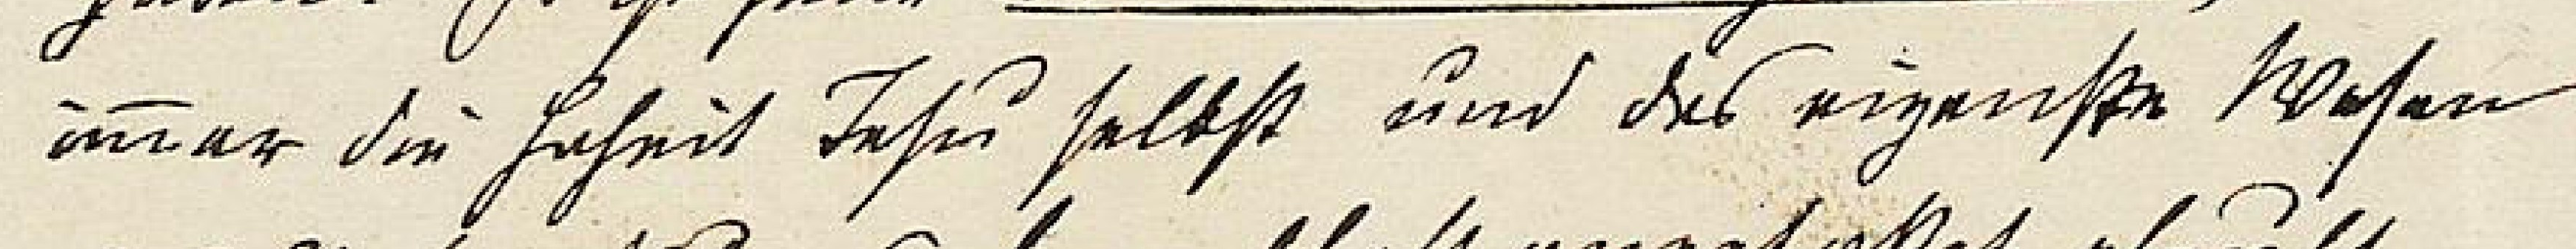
imer die Hoheit Jesu selbst und das eigenste Wesen
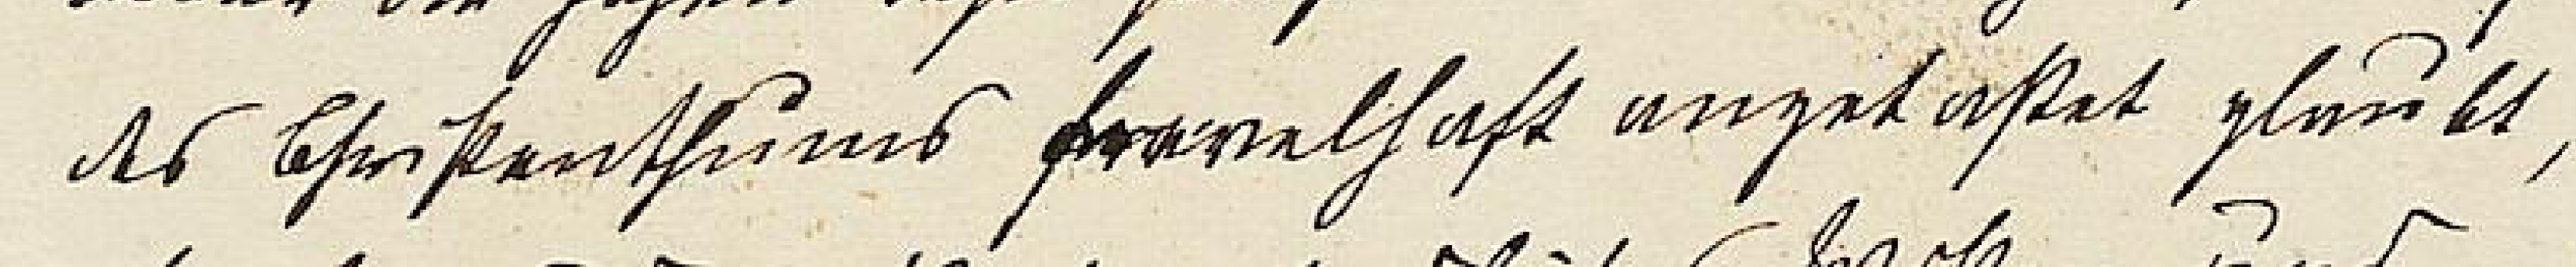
des Christenthums formelhaft angetastet glaubt,
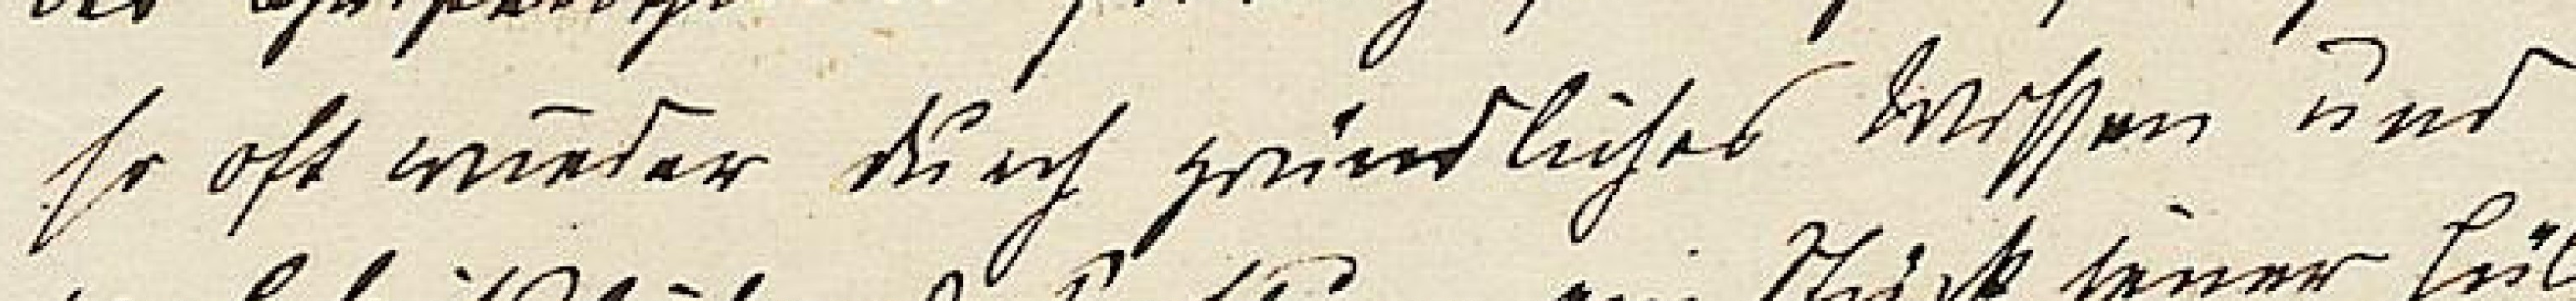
so oft wieder durch gründliches Wissen und
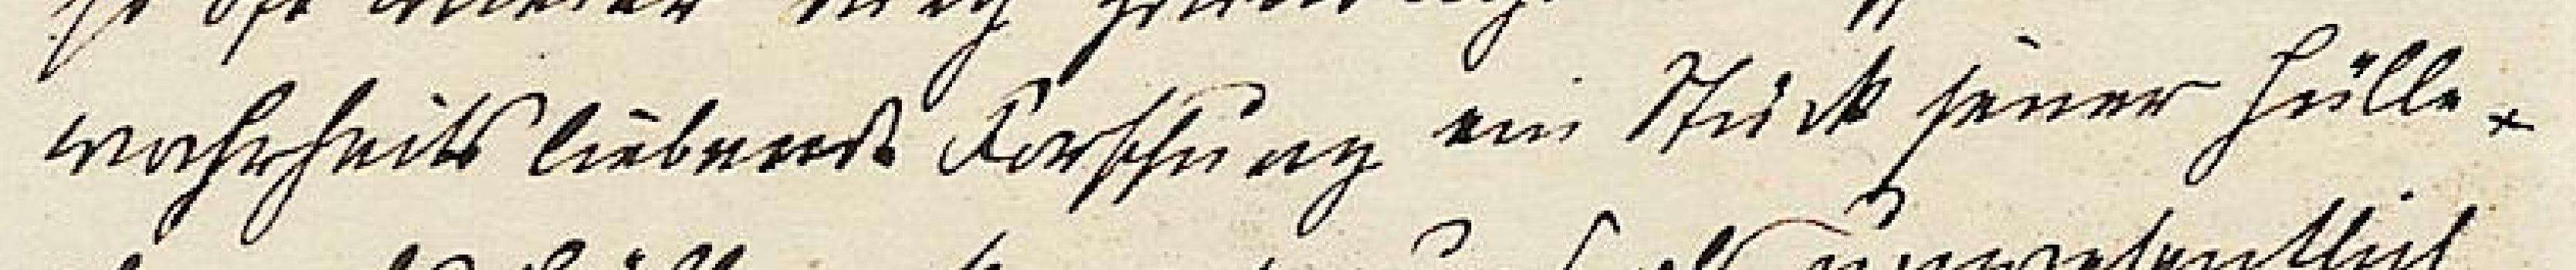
wahrheitsliebende Forschung ein Stück jener Fülle
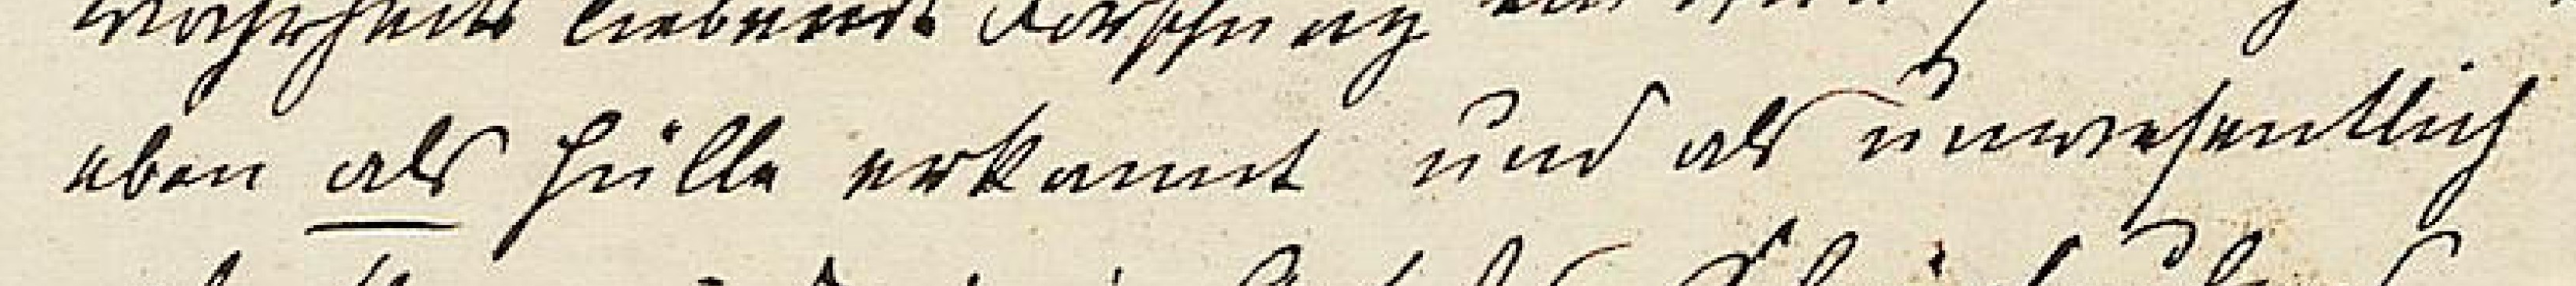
eben als Hülle erkannt und als unwesentlich
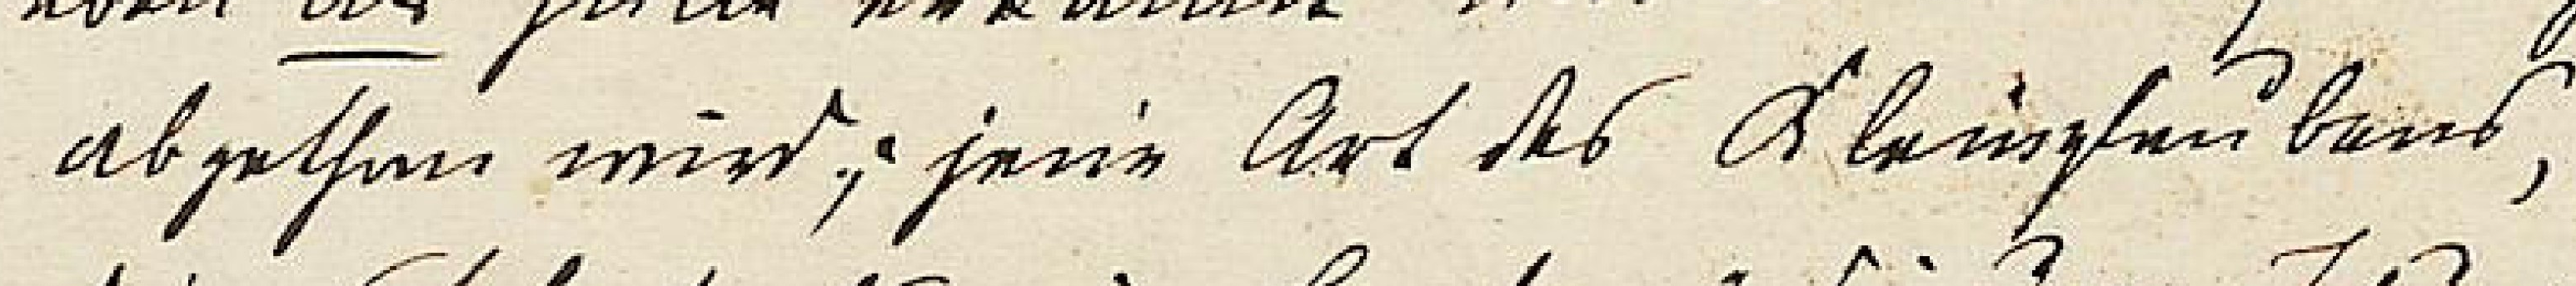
abgethan wird; jene Art des Kleinglaubens
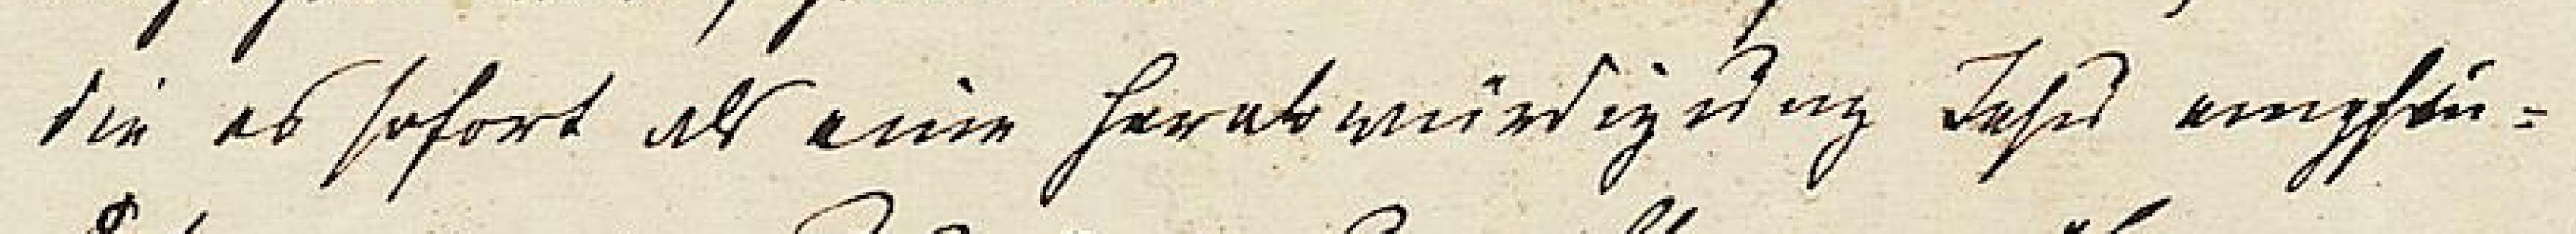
die es sefort als eine Herabwürdigung Jesu empfind¬
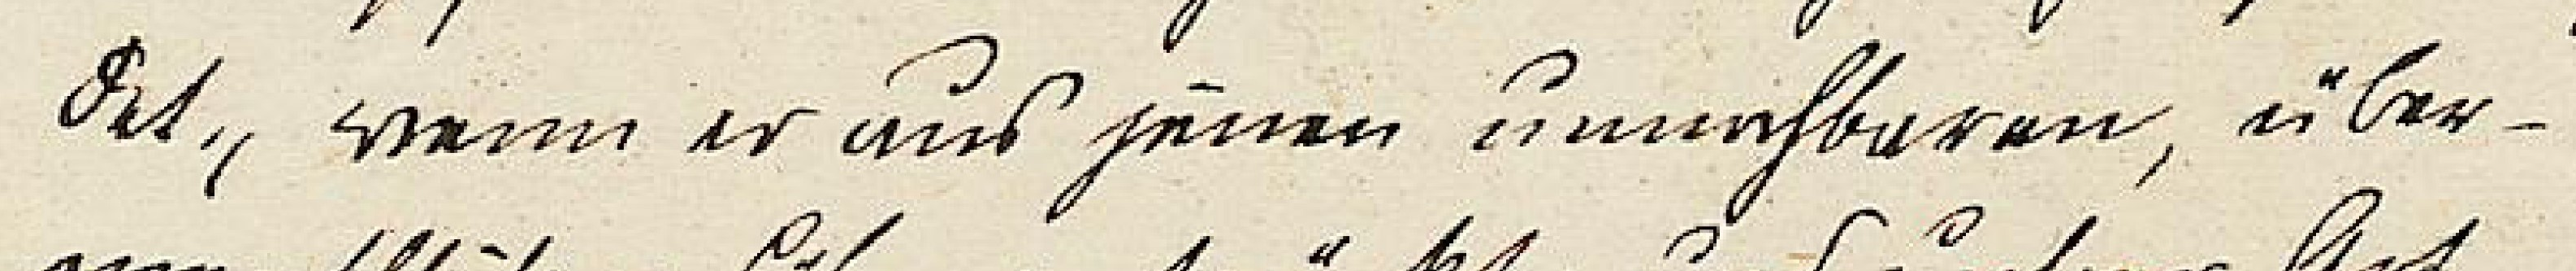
det, wenn er aus jenen unnahbaren, über¬
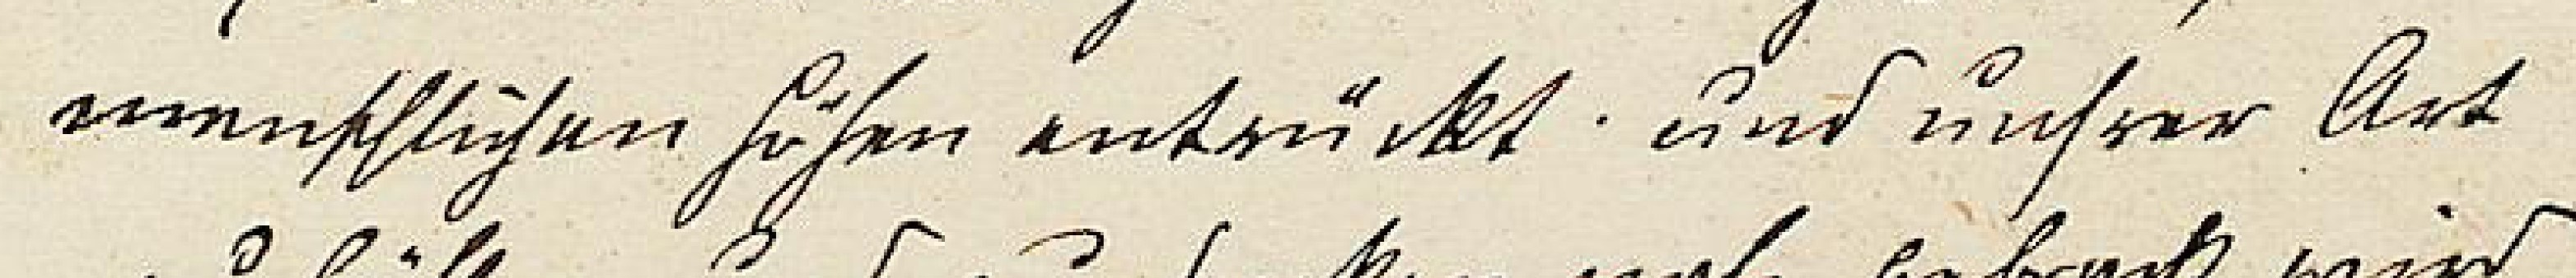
menschlichen Höhen entrückt und unsrer Art
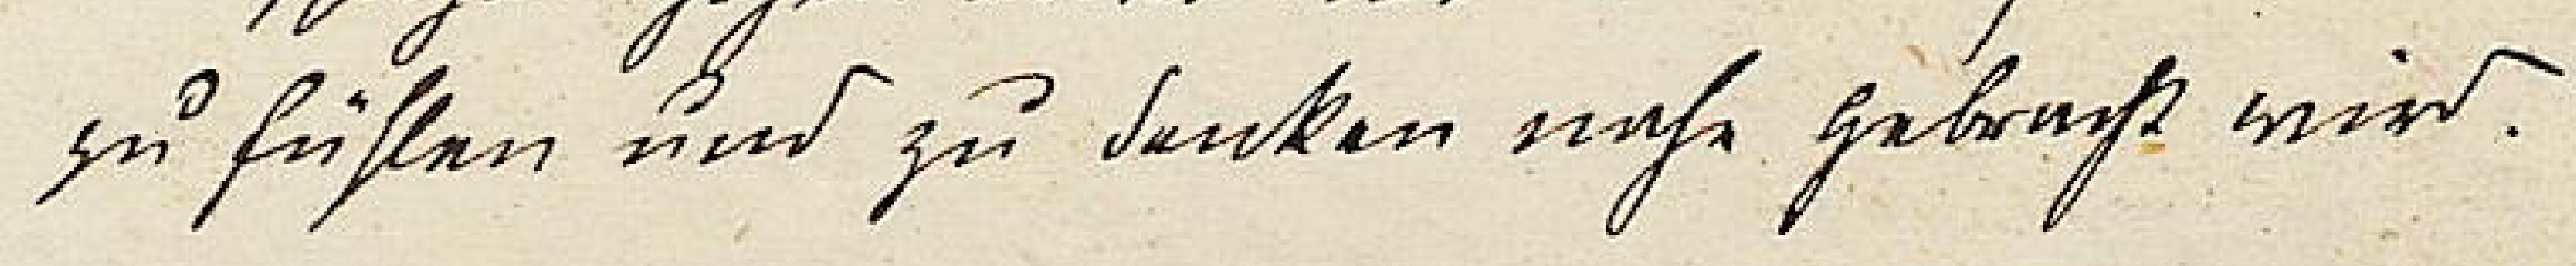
zu fühlen und zu denken nahe gebracht wird.
